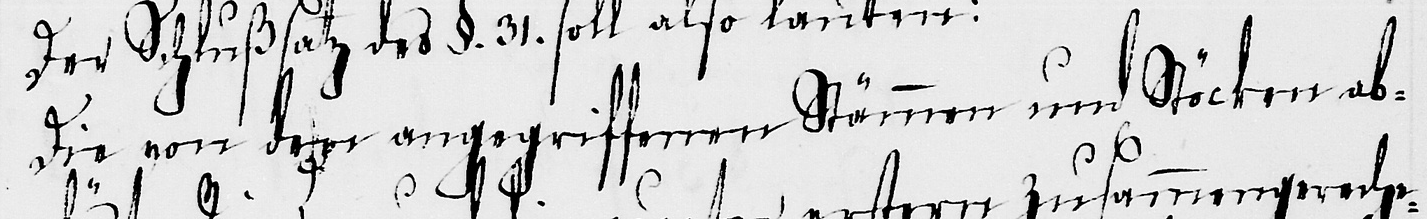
Die von den angegriffenen Stämmen und Stöcken ab¬
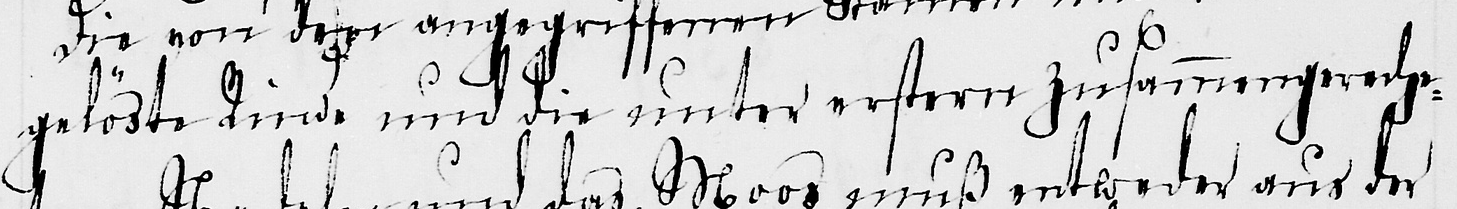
gelöste Rinde und die unter erstern zusammengereche¬
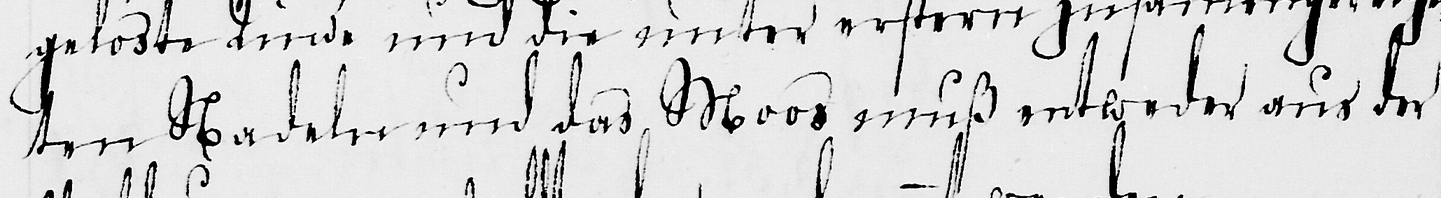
ten Nadeln und das Moos muß entweder aus der
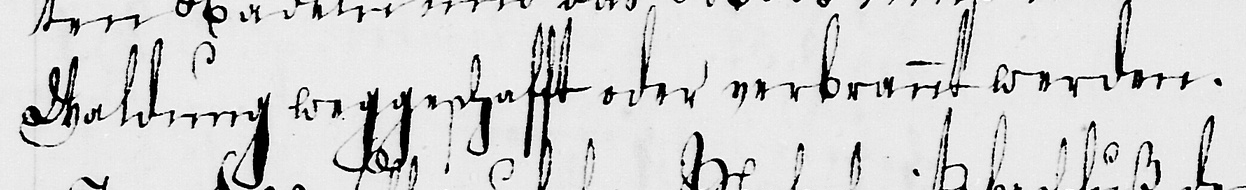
Waldung weggeschafft oder verbrannt werden.
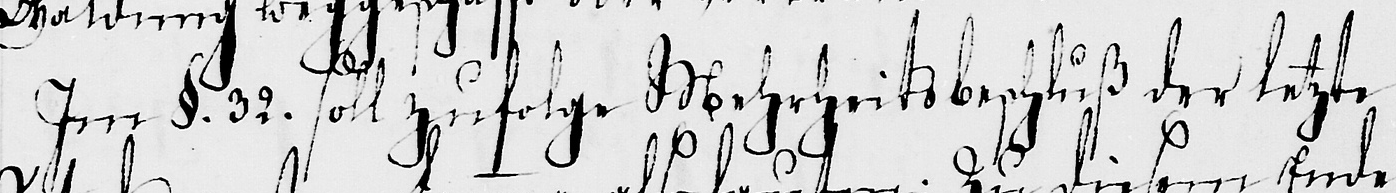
Im §. 32. soll zufolge Mehrheitsbeschluß der letzte
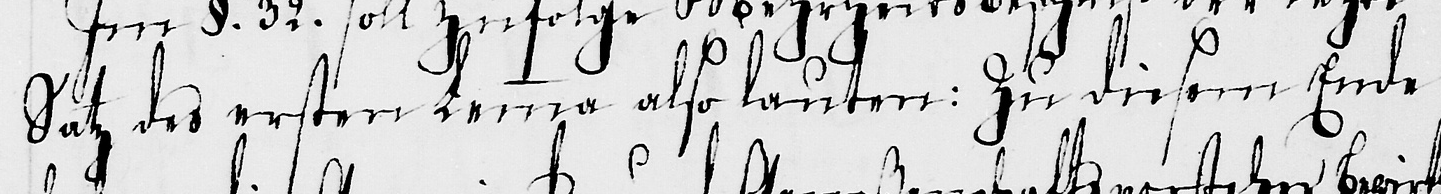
Satz des ersten Lemma also lauten: Zu diesem Ende
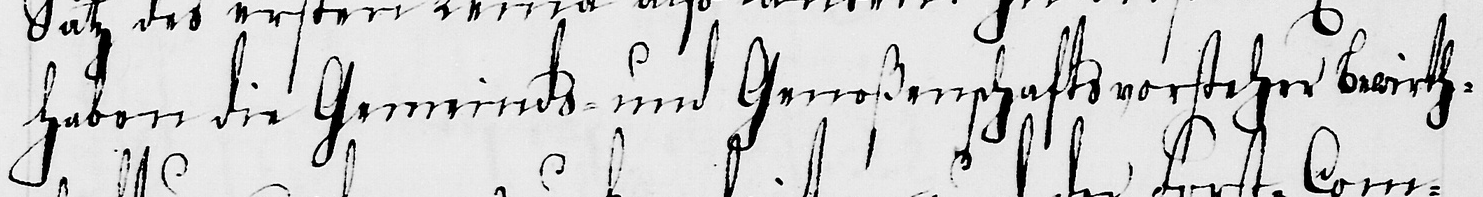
haben die Gemeinds- und Genoßenschaftsvorsteher Bewirth¬
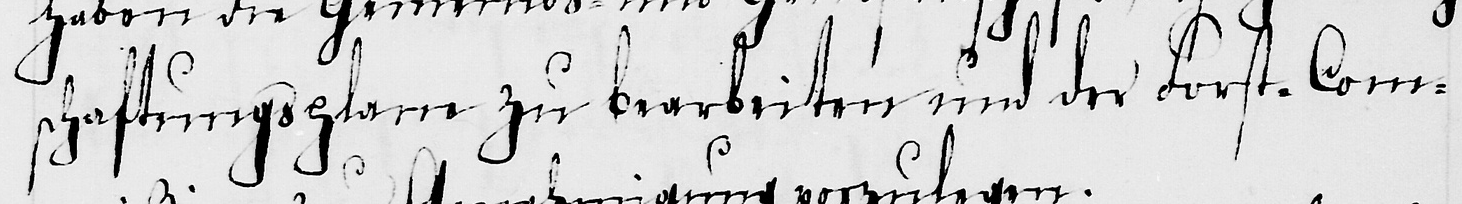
schaftungsplane zu bearbeiten und der Forst-Com¬
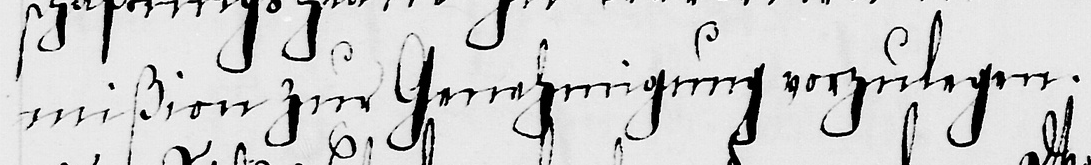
mißion zur Genehmigung vorzulegen.
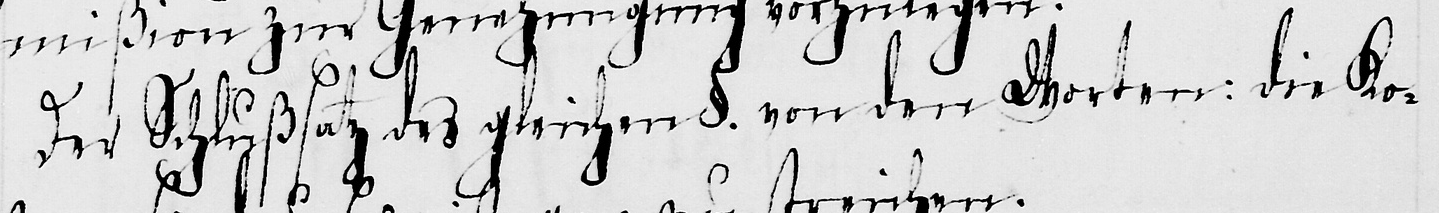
Der Schlußsatz des gleichen §. von den Worten: die Ko¬
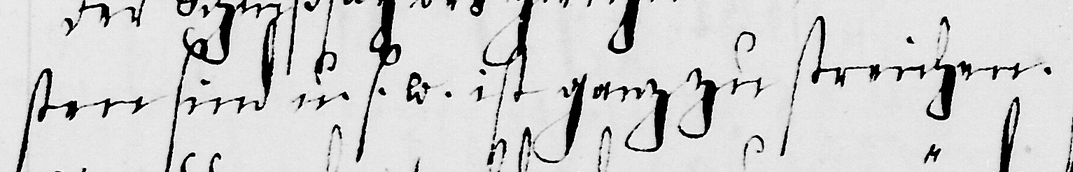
sten sind u. s. w. ist ganz zu streichen.
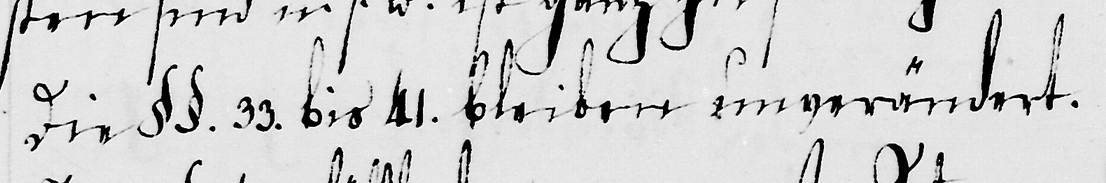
Die §§. 33. bis 41. bleiben unverändert.
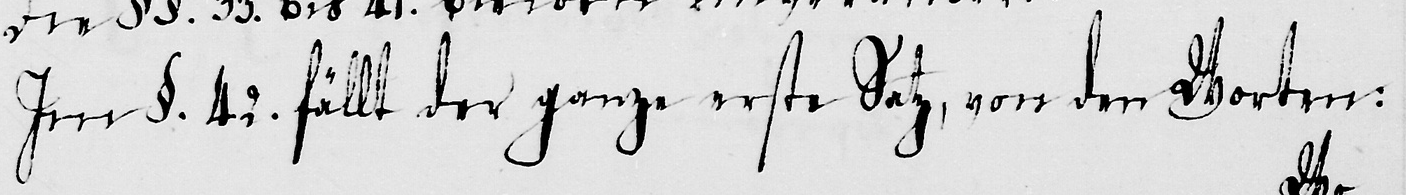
Im §. 42. fällt der ganze erste Satz, von den Worten:
